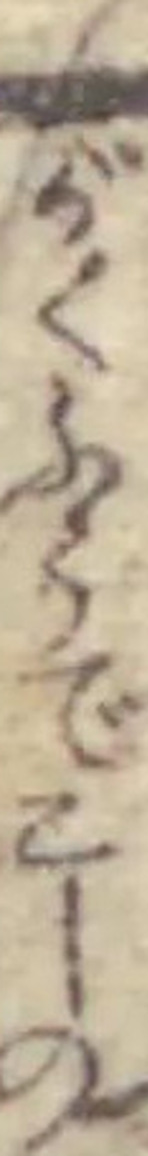がくふうでこしの
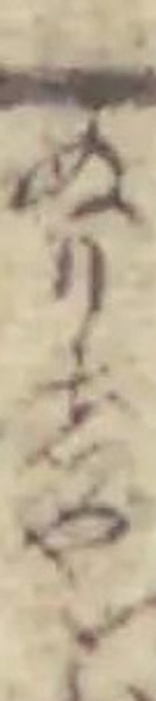ぬりしや
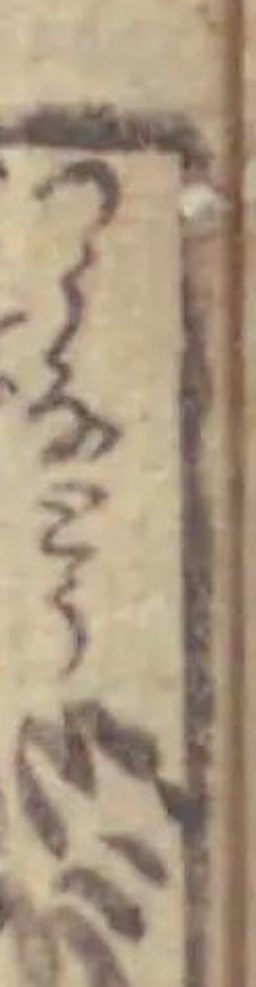つうなとう
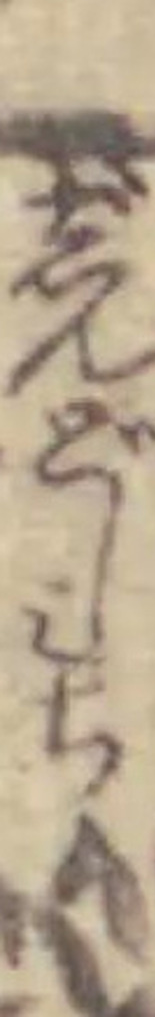じんどしみち
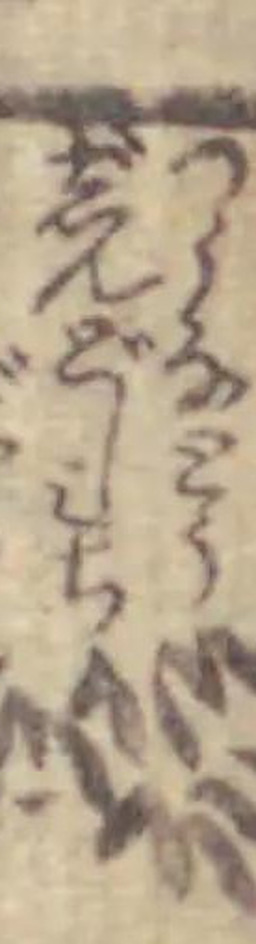じんどしみち
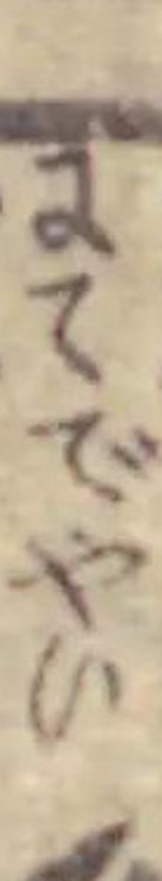にてでやい
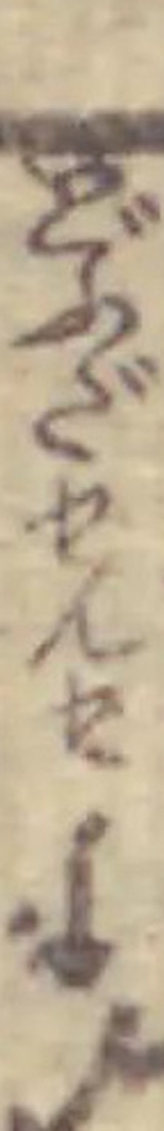どふだせんせ
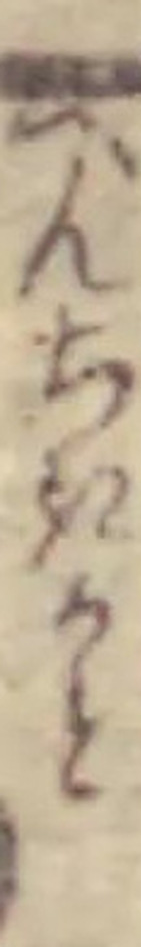へんちきかと
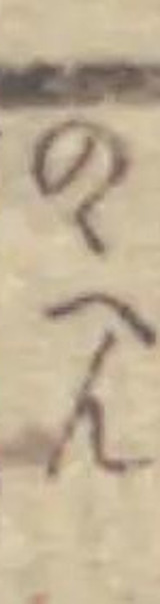のゝへん
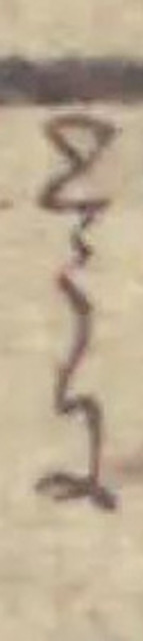とうに
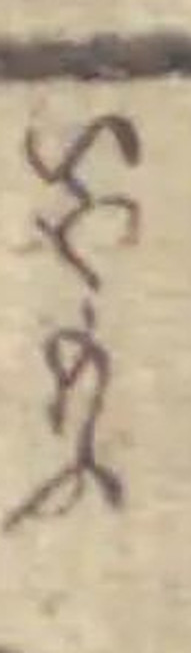いやもふ
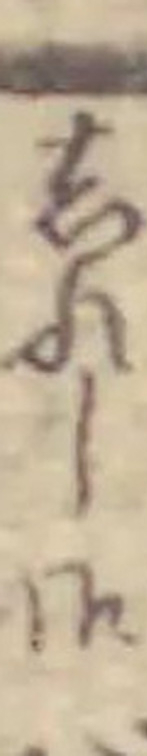しれし御
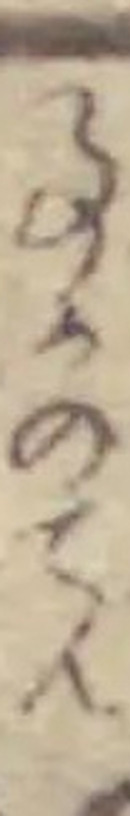事かのてん
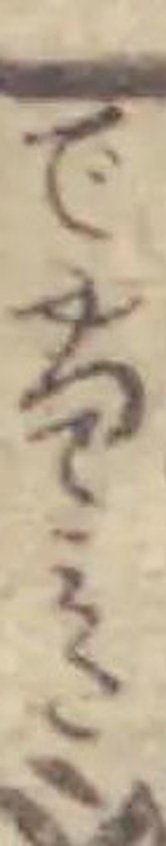でやつてみた
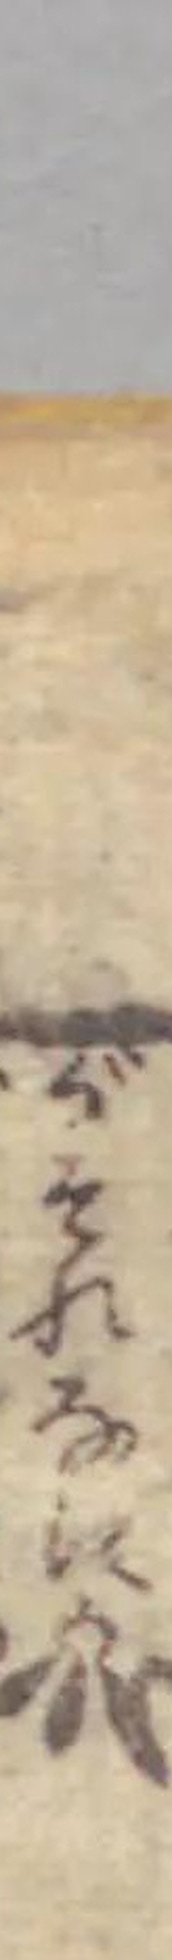がそれなにか
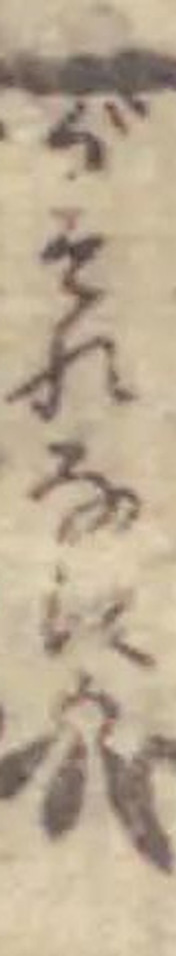がそれなにか
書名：茶羅毛通人 3巻
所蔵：国立国会図書館 National Diet Library, JAPAN
